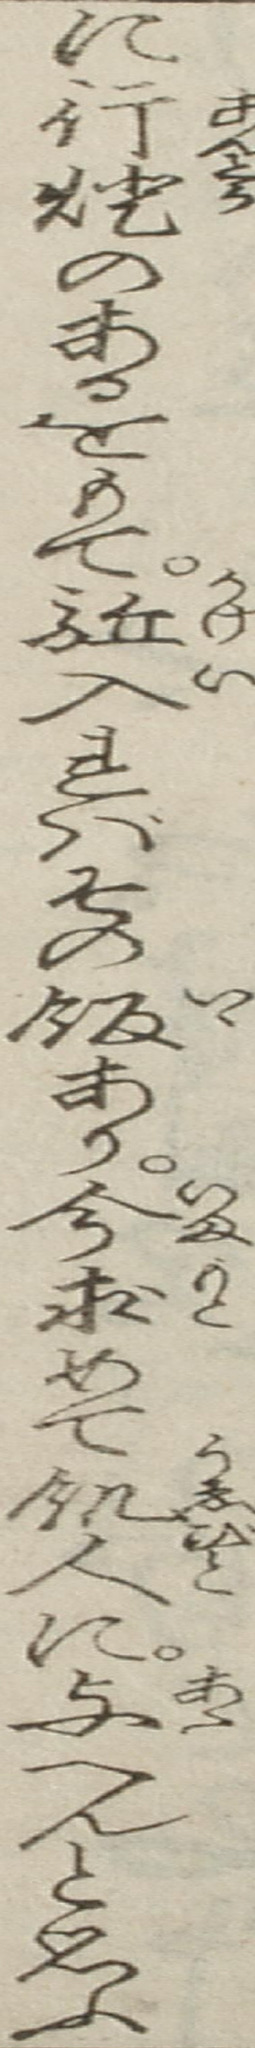に行燈のあるをもて。駈入ればその飯あり。今求めて飢人に。与へんと思ふ
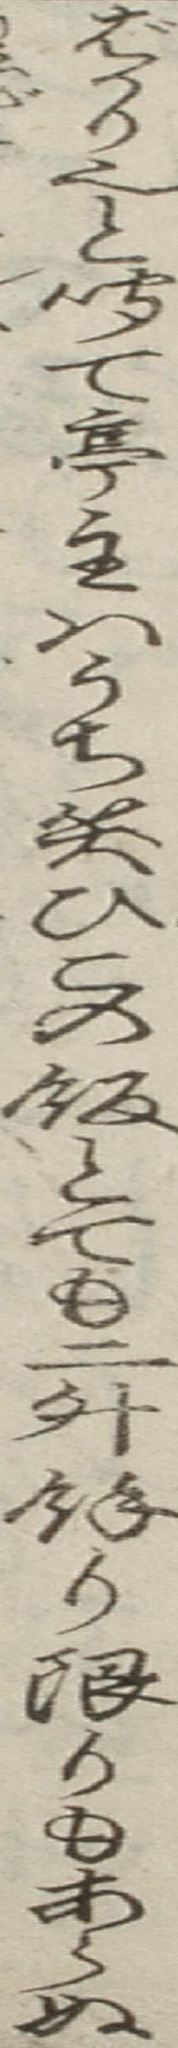ばかり也。と聞て亭主はうち笑ひ。この飯とても二升餘り限りもあらぬ
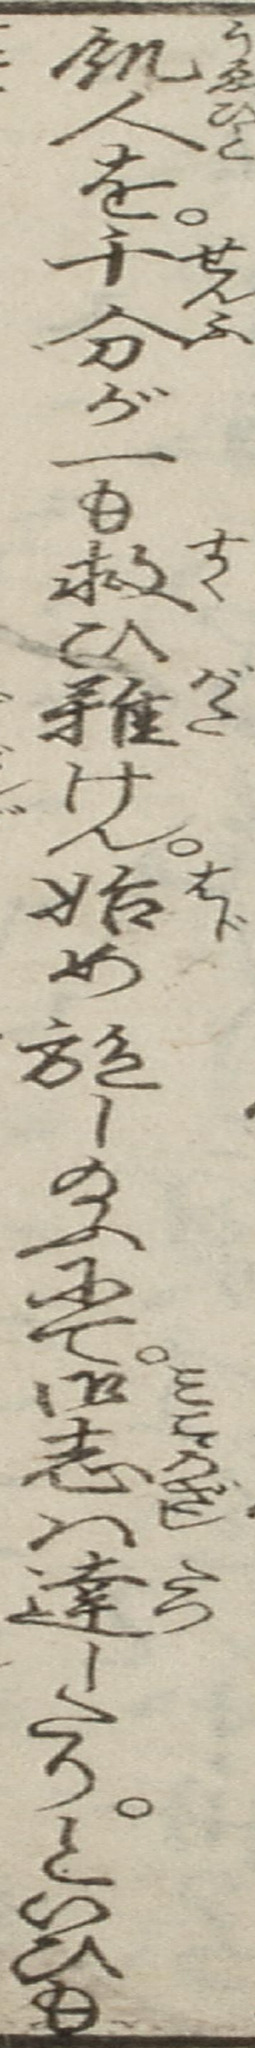飢人を。千分が一も救ひ難けん。始め施し給ふにて。御志は達したり。といひも
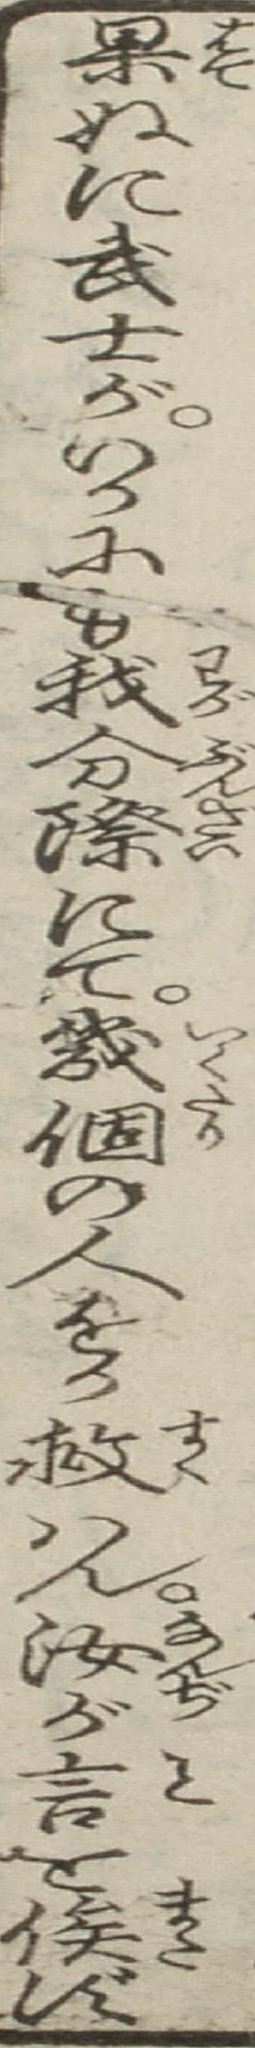果ぬに武士が。いかにも我分際にて。幾個の人をか救はん。汝が言を俟ず
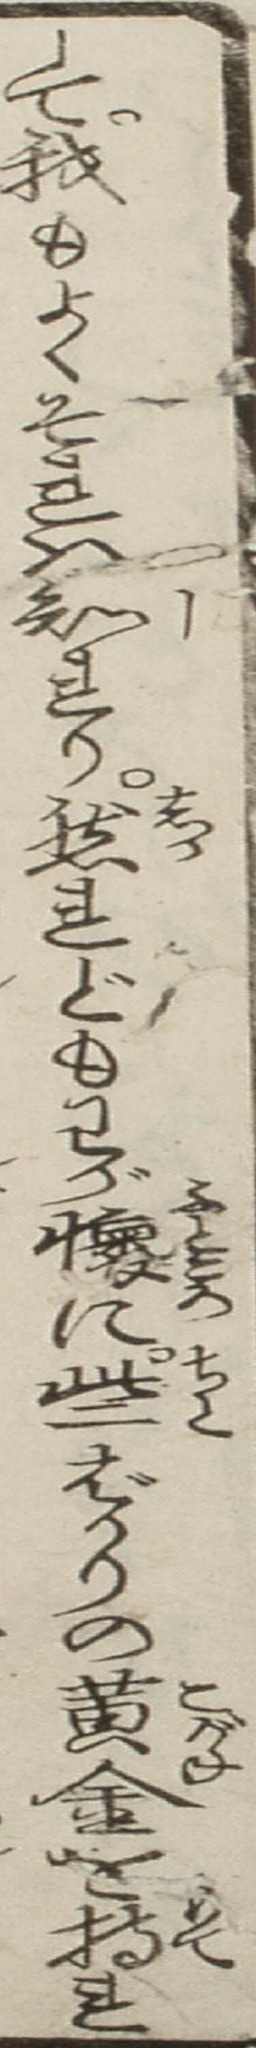して我もよくそれは知れり。然れどもわが懐に。些ばかりの黄金を持れ
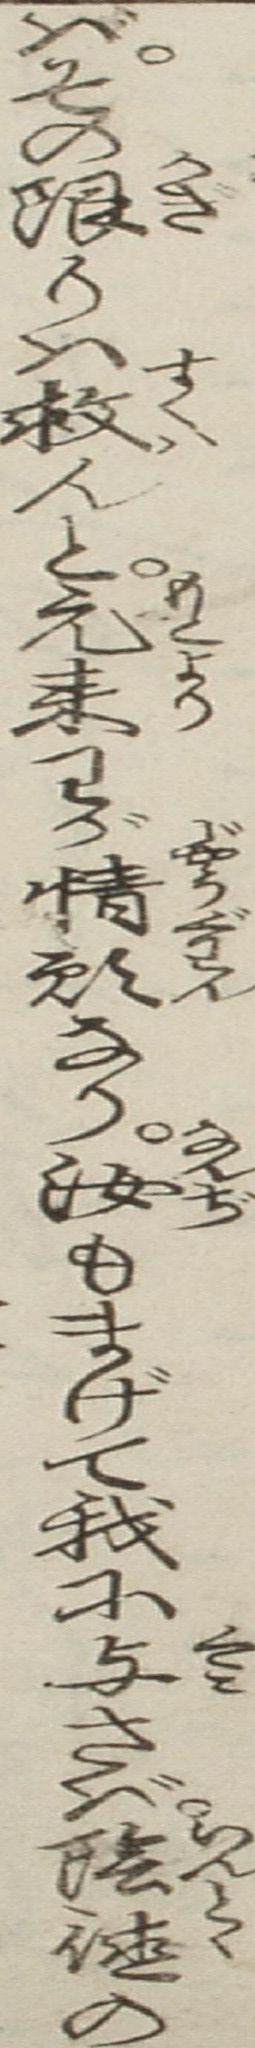ば。その限りは救んと。元来わが情願なり。汝もまげて我に与さば。陰徳の
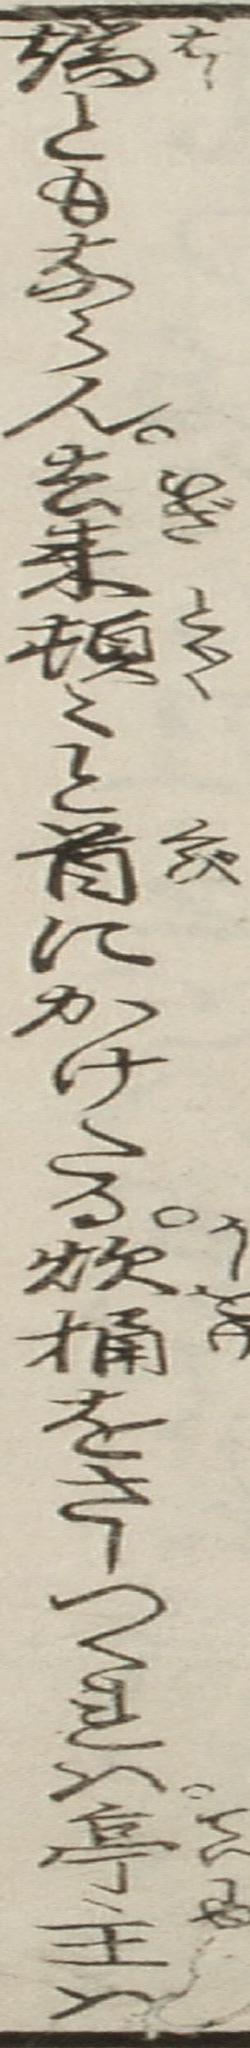端ともならん。去来頓々と首にかけたる。炊桶をさしつくれは。亭主は
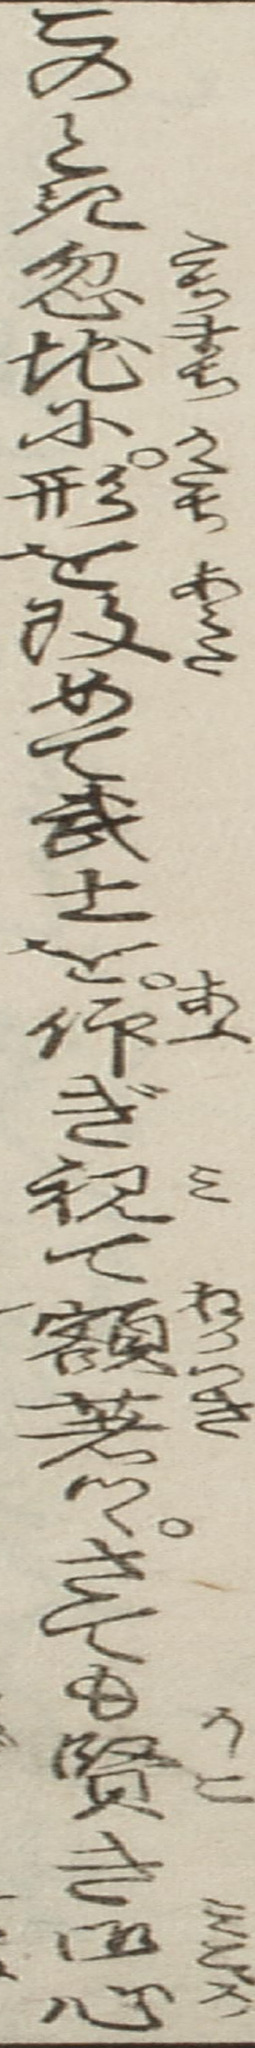このとき忽地に。形を改めて武士を。仰ぎ視て額著つゝ。さても賢き御心
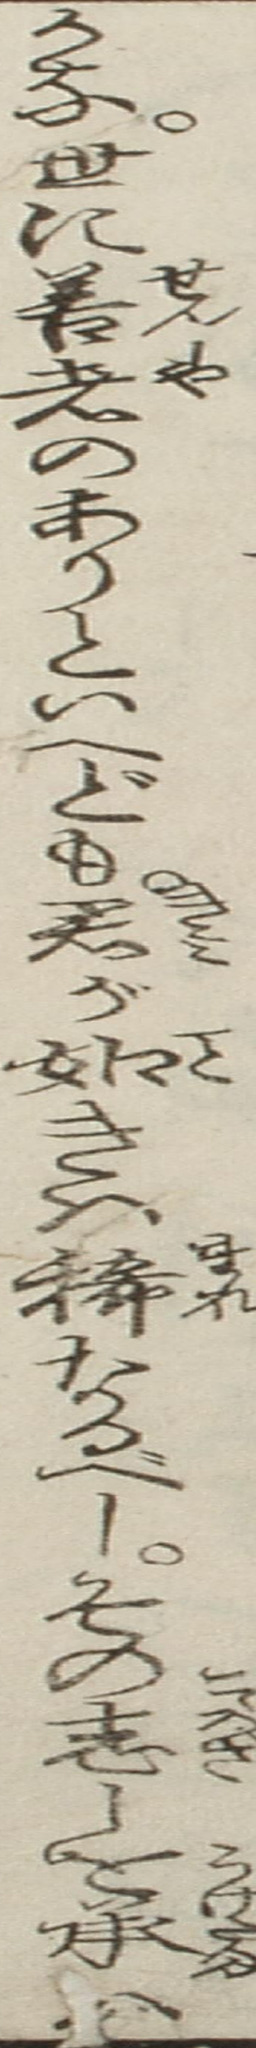かな。世に善者のありといへども。君が如きは稀なるべし。その志しを承は
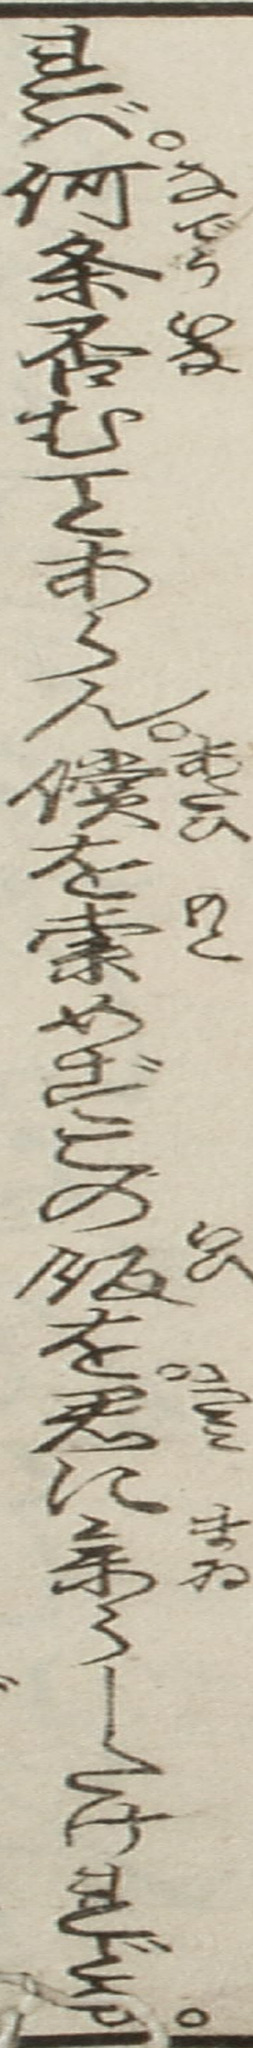れば。何条否むことあらん。償を索めずこの飯を。君に参らしたけれども。
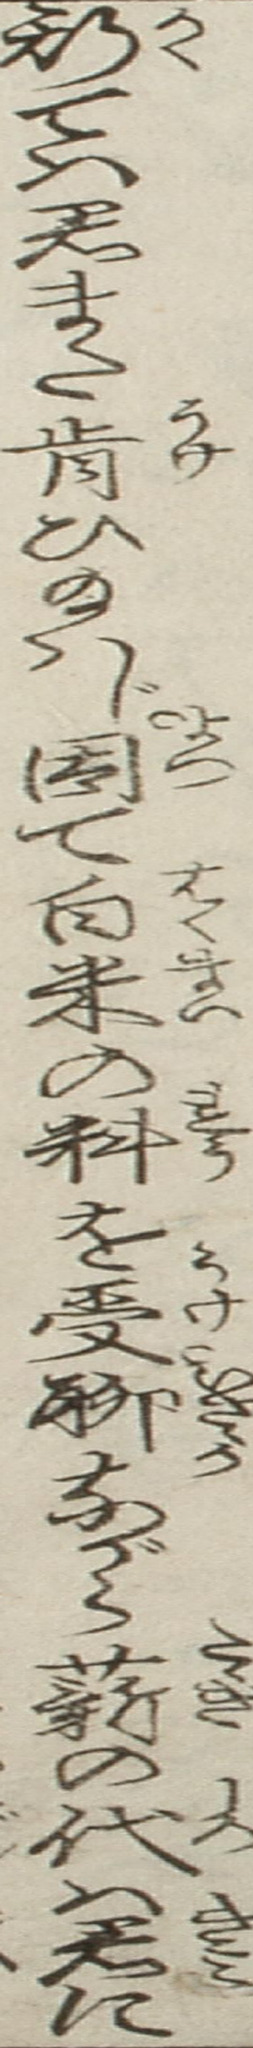斯ては君また肯ひ給はじ。因て白米の料を受聊ながら薪の代は君に
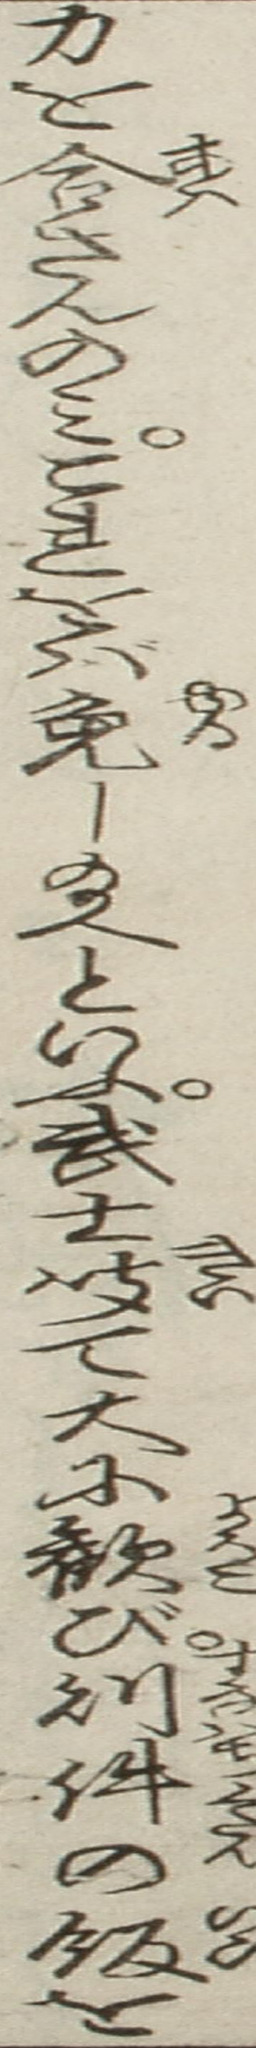力を合さんのみ。これをば免し給へといふ。武士聞て大に歓び。則件の飯を
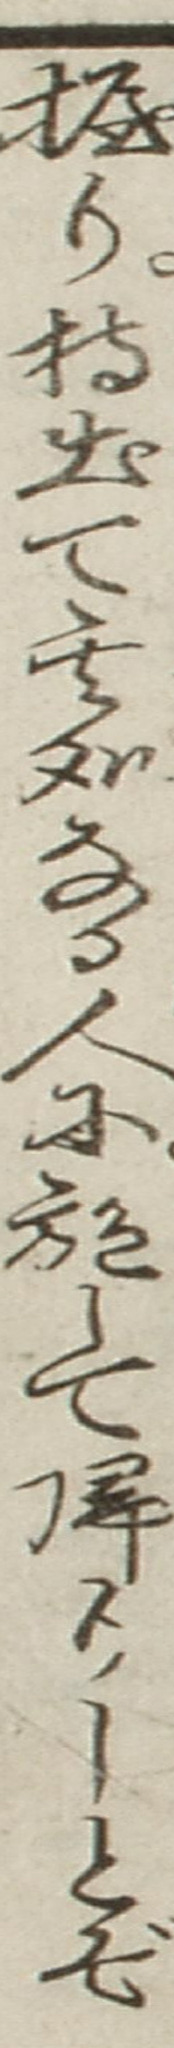握り。持出て其処なる人に。施して帰りしとぞ
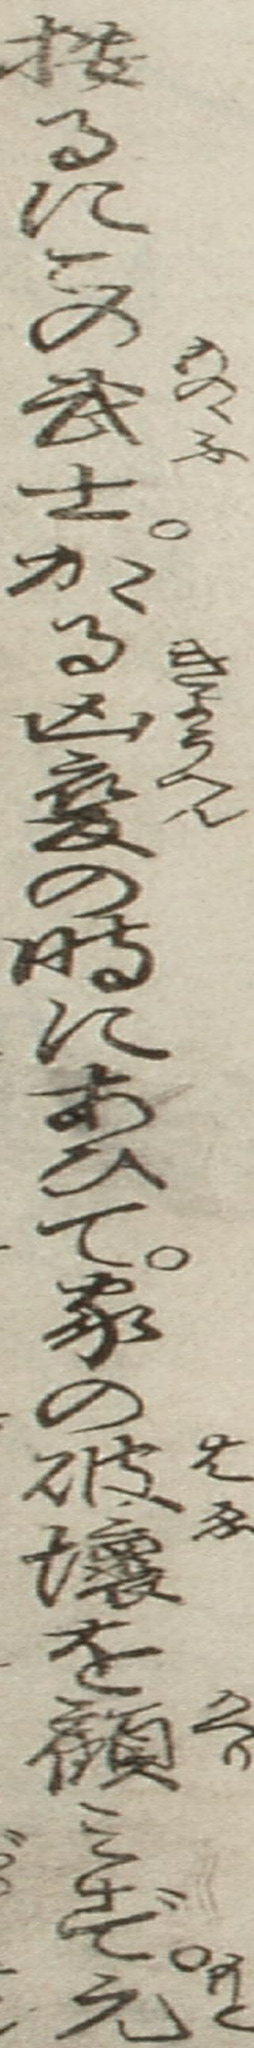按るにこの武士。かゝる凶変の時にあひて。家の破壊を顧みず。元
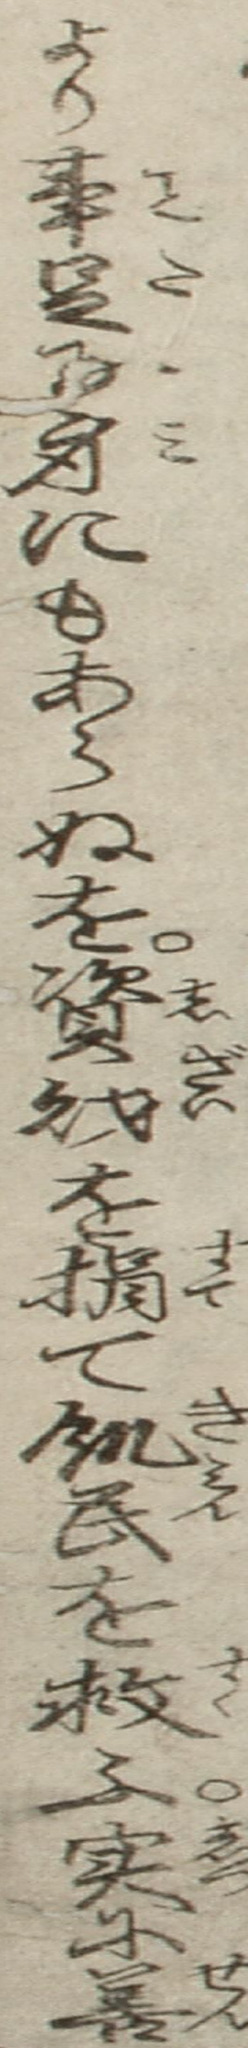より事足る身にもあらぬを。資財を捐て飢民を救ふ。実に善

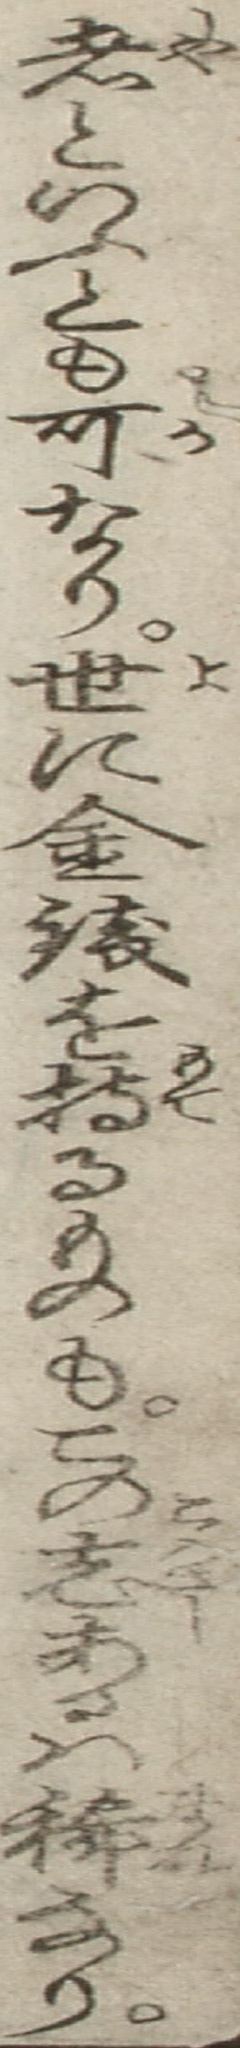者といふとも可なり。世に金銭を持るものも。この志あるは稀なり。
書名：安政見聞録　上
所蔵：東京大学地震研究所図書室 Earthquake Research Institute Library, The University of Tokyo, JAPAN
